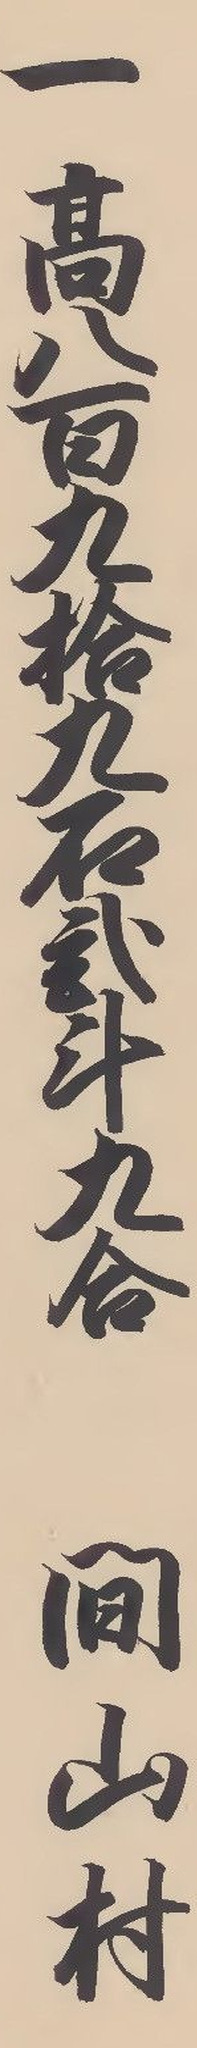一高八百九拾九石弐斗九合間山村
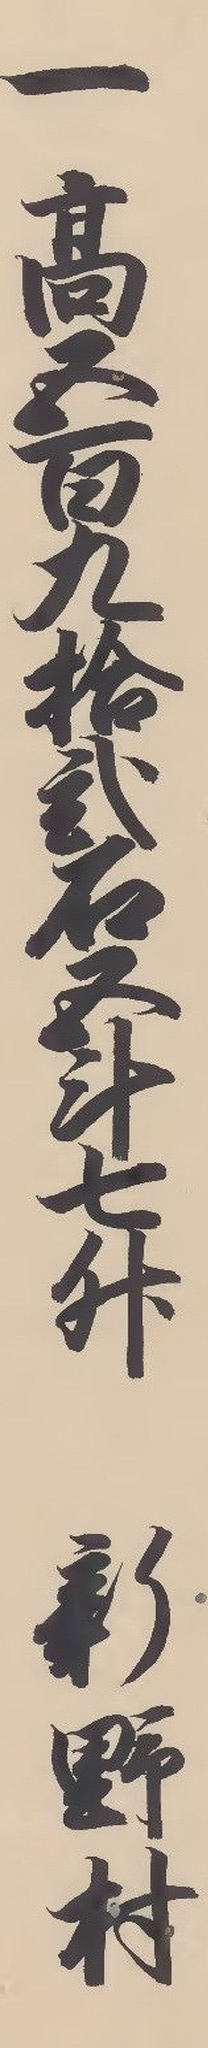一高五百九拾弐石五斗七升新野村
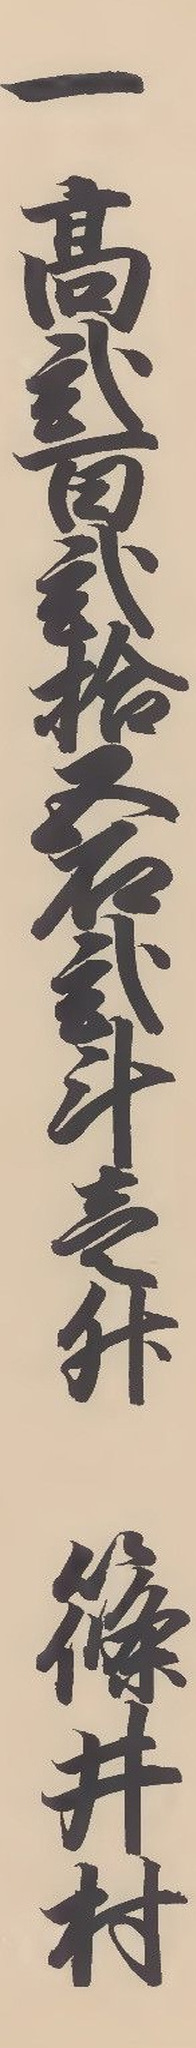一高弐百弐拾五石弐斗壱升篠井村
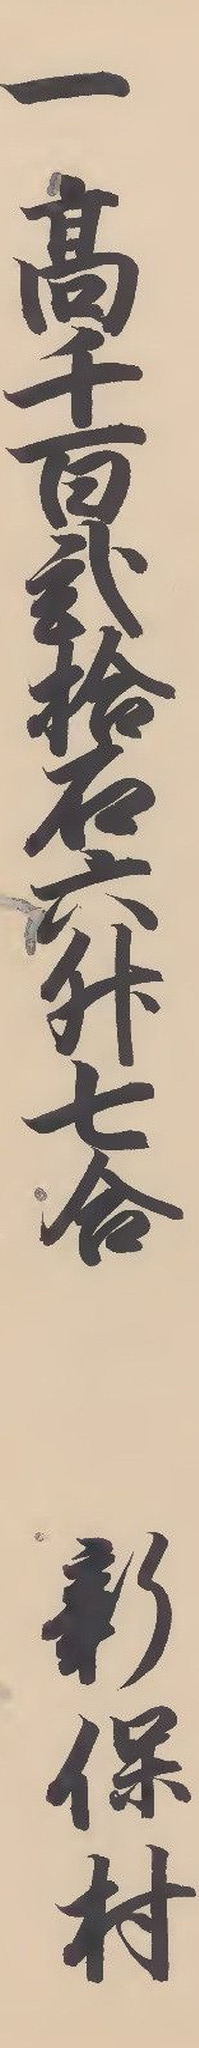一高千百弐拾石六升七合新保村

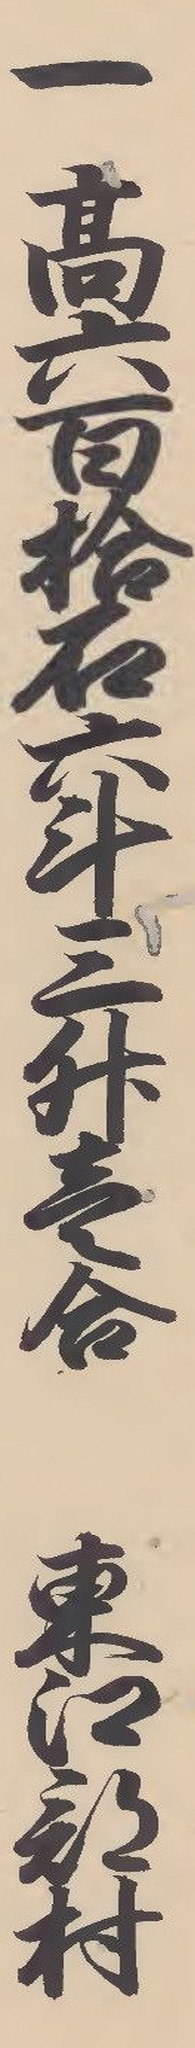一高六百拾石六斗三升壱合東江部村
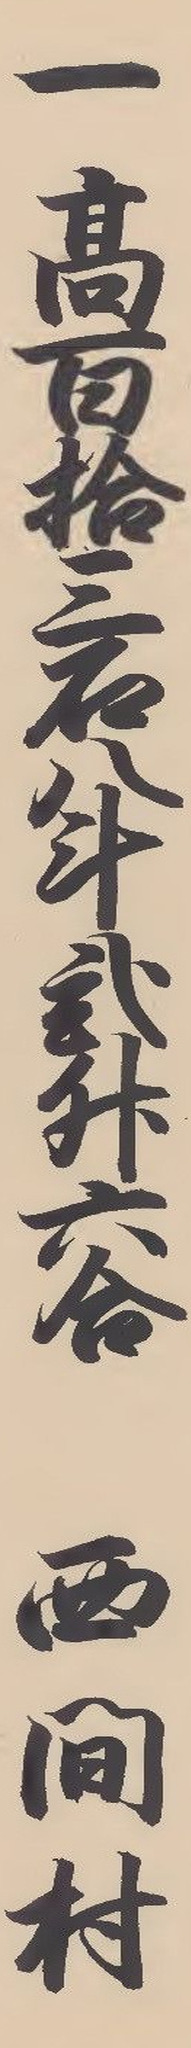一高百拾三石八斗弐升六合西間村
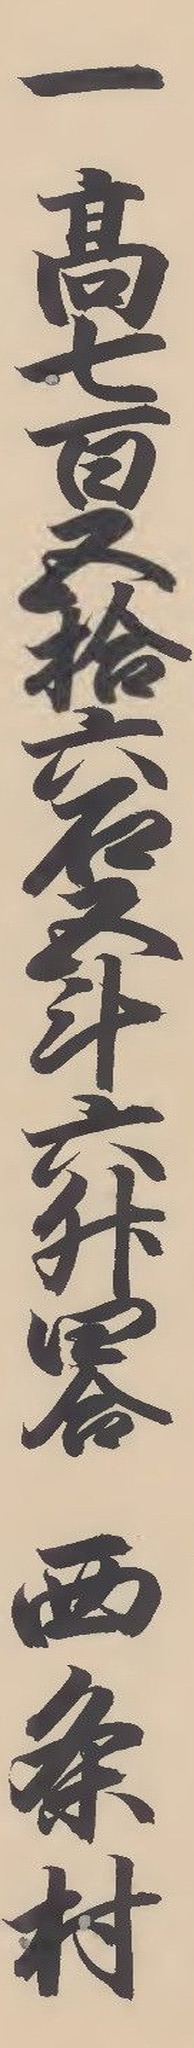一高七百五拾六石五斗六升四合西条村
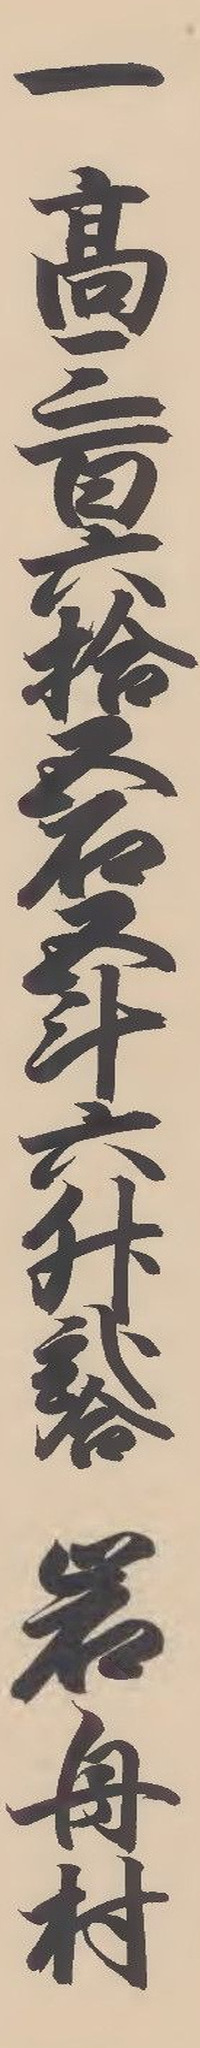一高三百六拾五石五斗六升弐合岩舟村
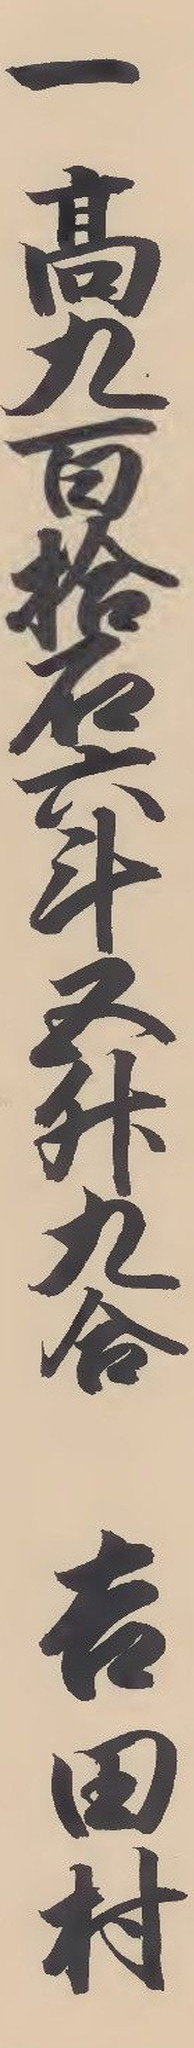一高九百拾石六斗五升九合吉田村
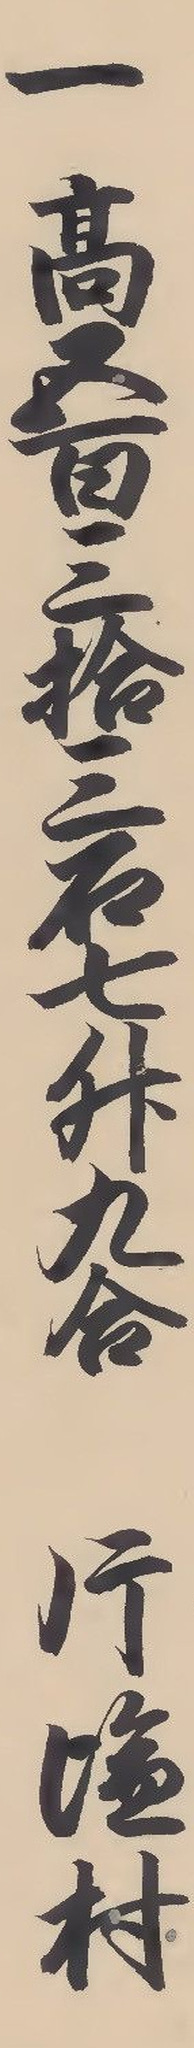一高五百三拾三石七升九合片塩村
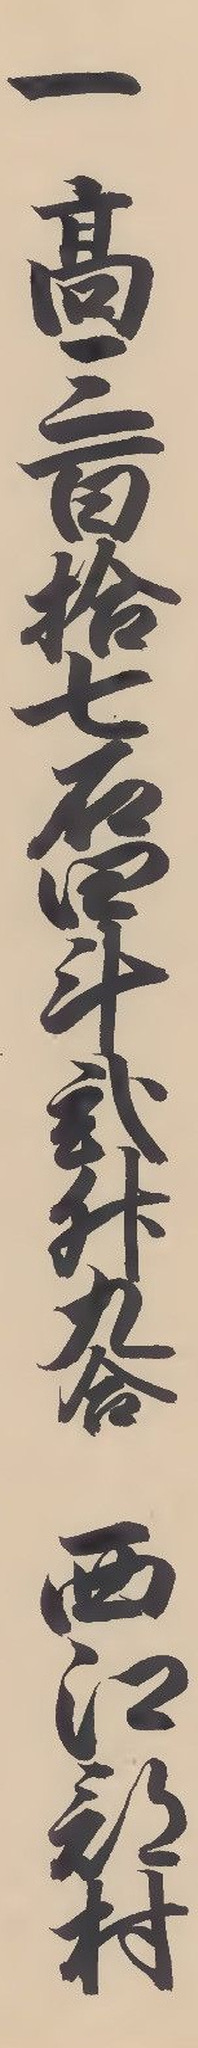一高三百拾七石四斗弐升九合西江部村
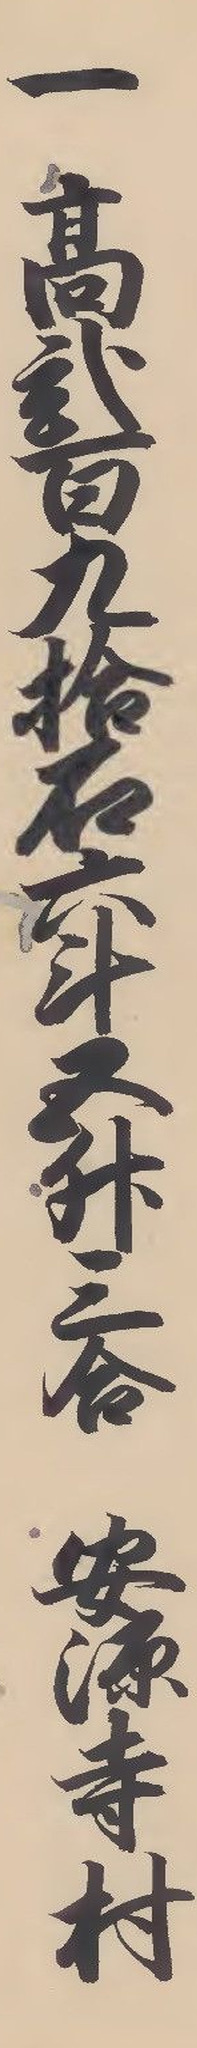一高弐百九拾石六斗五升三合安源寺村

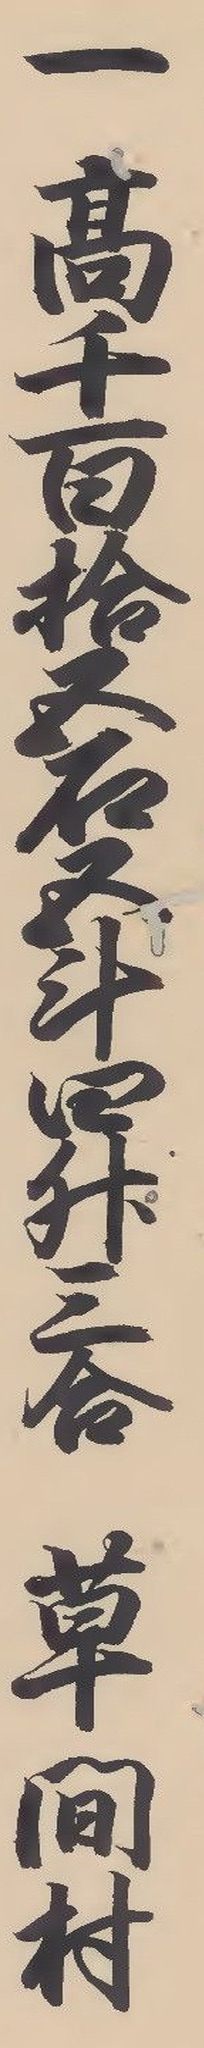一高千百拾五石五斗四升三合草間村
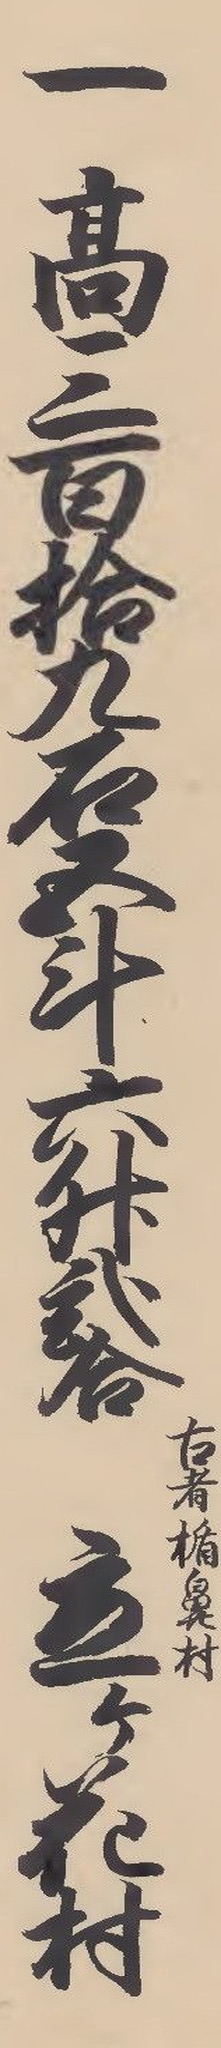一高三百拾九石五斗六升弐合立ヶ花村
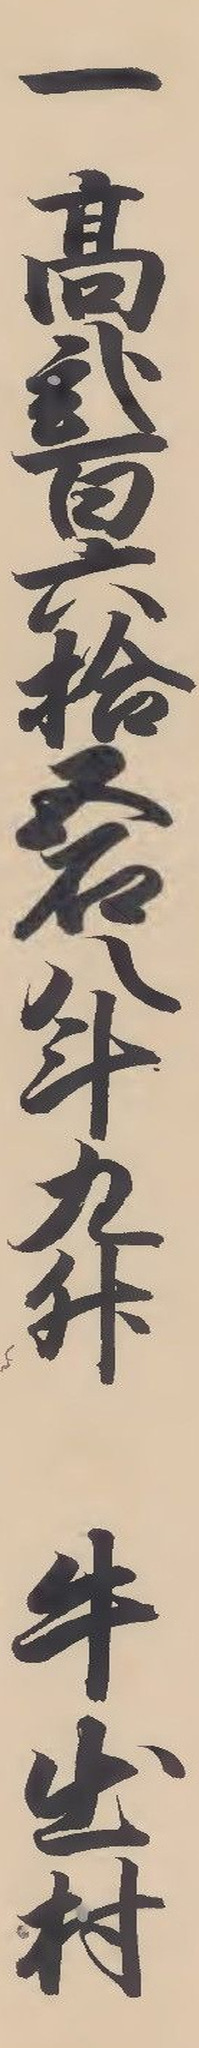一高弐百六拾五石八斗九升牛出村
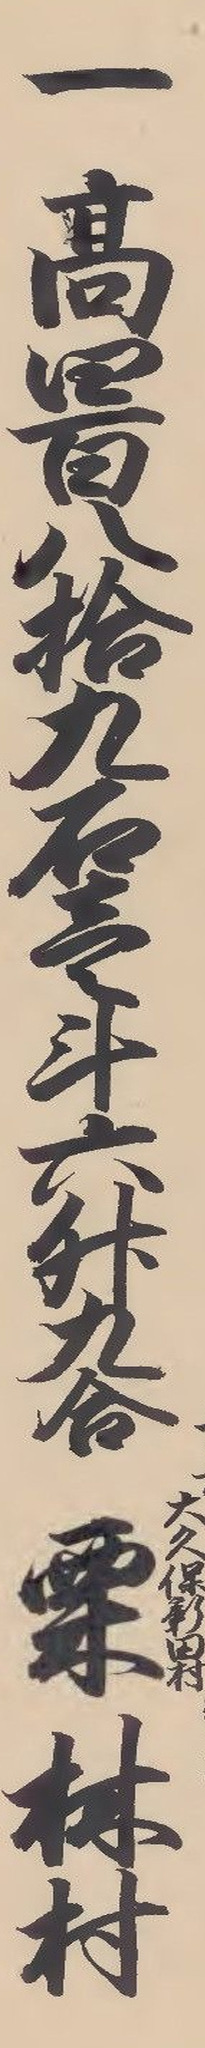一高四百八拾九石壱斗六升九合栗林村
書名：信濃国郷帳
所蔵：国立公文書館 National Archives of Japan
